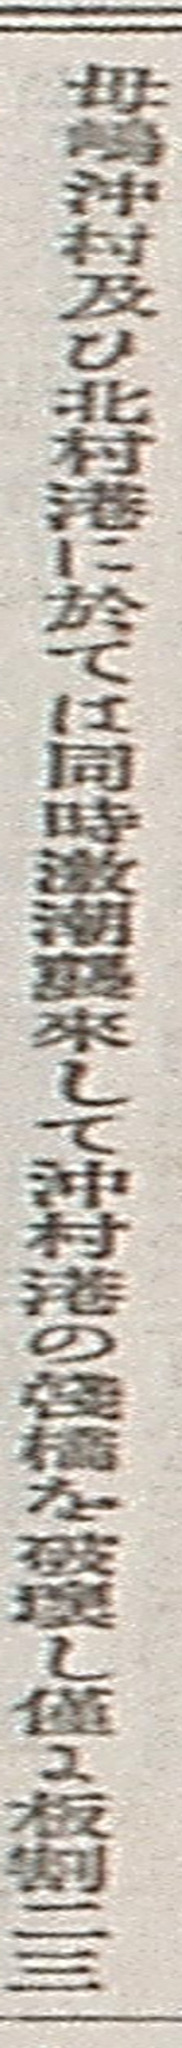母嶋沖村及ひ北村港に於ては同時激潮襲来して沖村港の桟橋を破壊し僅に板割二三
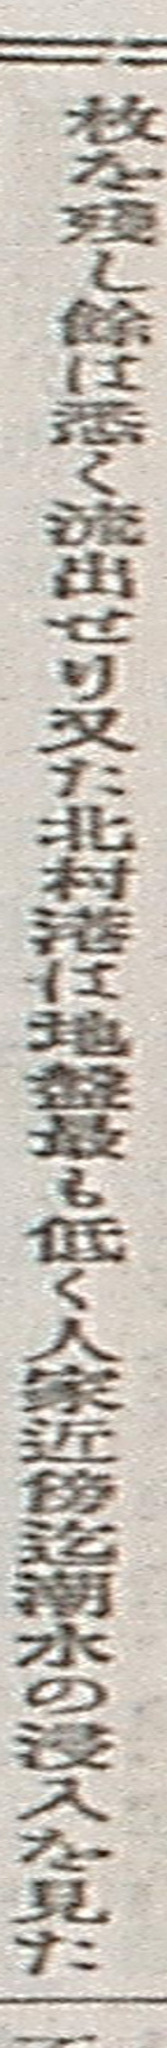枚を残し余は悉く流失せり又た北村港は地盤最も低く人家近傍迄潮水の浸入を見た
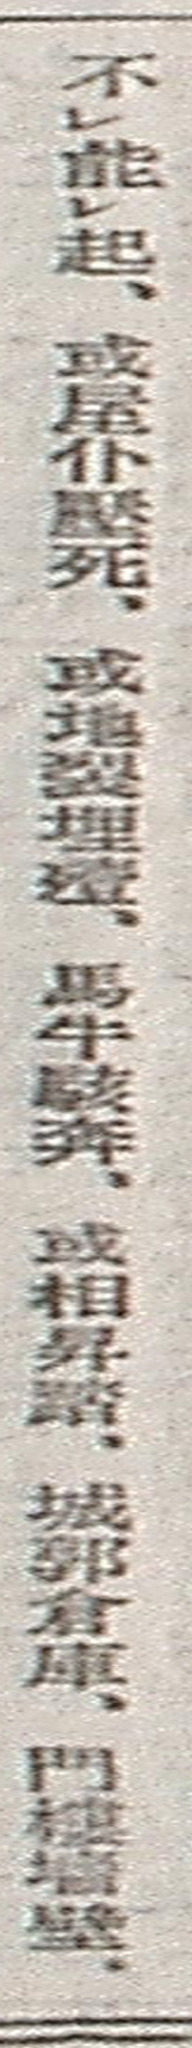不能起、或屋仆圧死、或地裂埋殪、馬牛駭奔、或相昇踏、城郭倉庫、門樓墻壁、

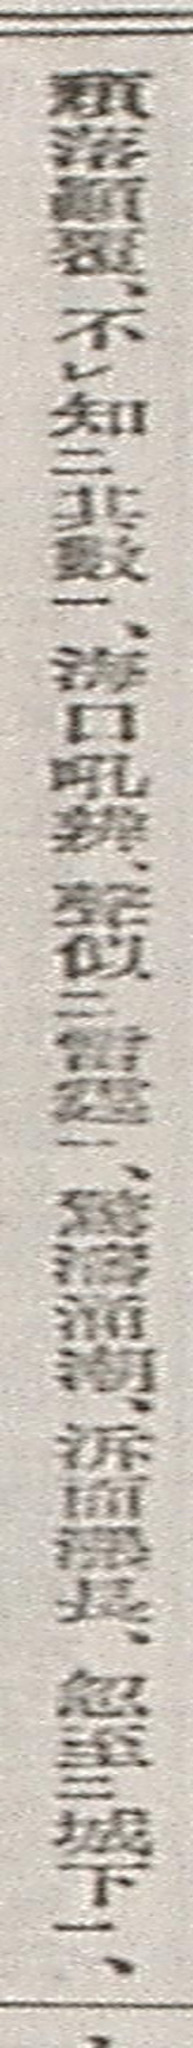類落顚覆、不知其数、海口吼辨、聲似雷霆、驚濤涌潮、泝而漲長、忽至城下、
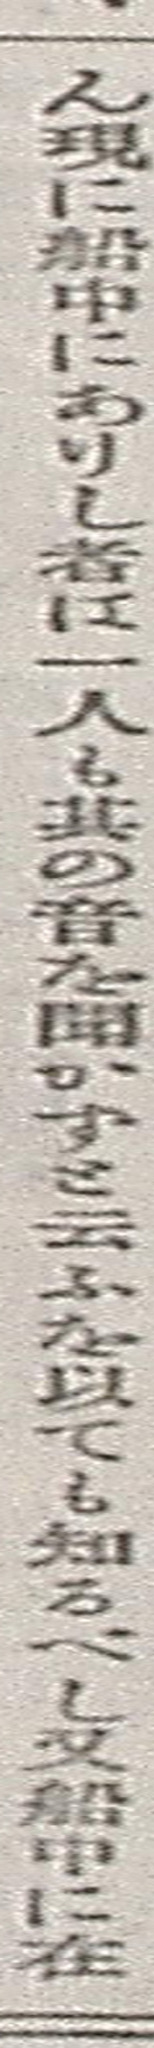ん現に船中にありし者は一人も其の音を聞かずと云ふを以ても知るべし又船中に在
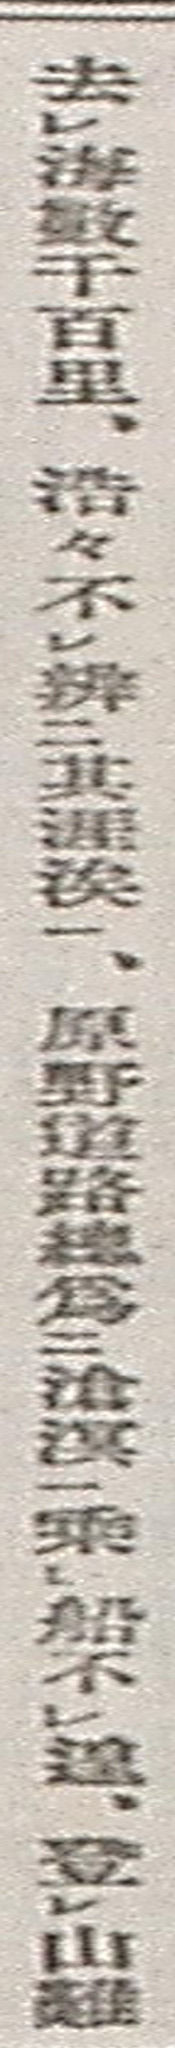去海数千百里、浩々不辨其涯涘、原野道路総為滄溟乗船不遑、登山難
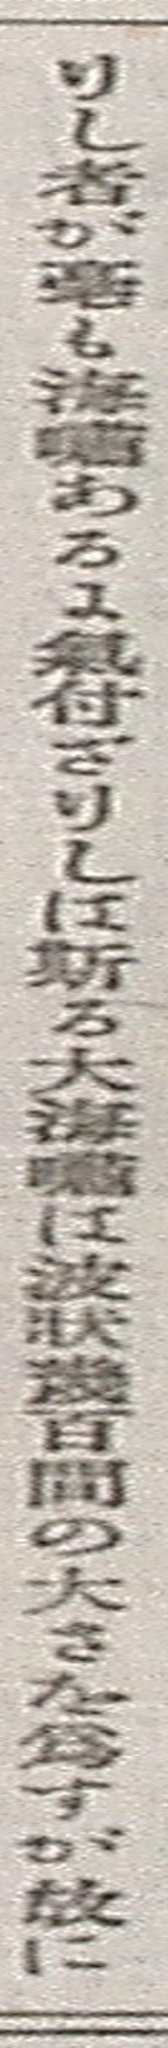りし者が毫も海嘯あるに気付ざりしは斯る大海嘯は波状幾百間の大さを為すが故に
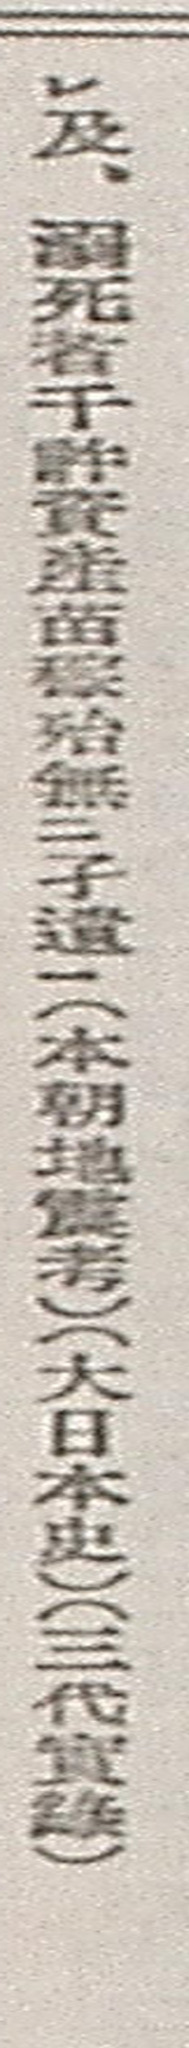及、溺死者千許資産苗稼殆無孑遺
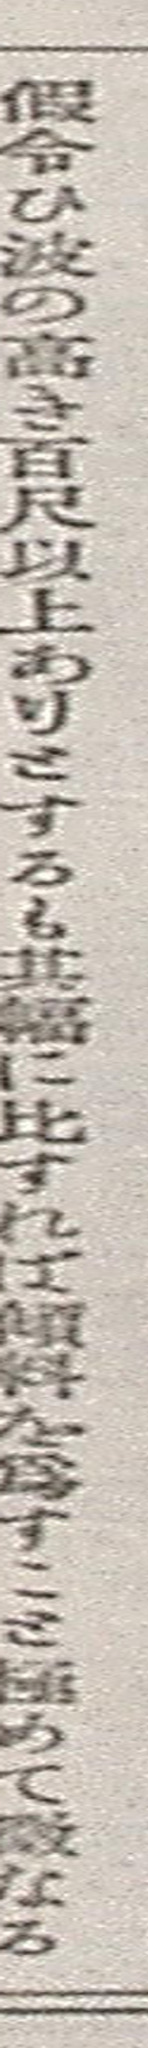仮令ひ波の高さ百尺以上ありとするも其幅に比すれば傾斜を為すこと極めて微なる
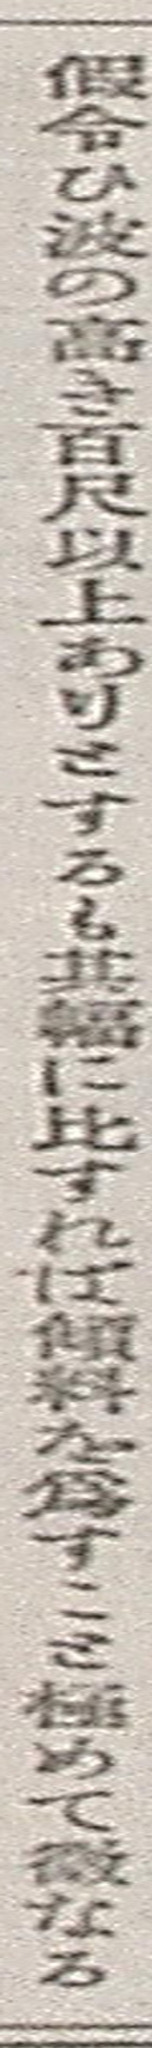仮令ひ波の高さ百尺以上ありとするも其幅に比すれば傾斜を為すこと極めて微なる
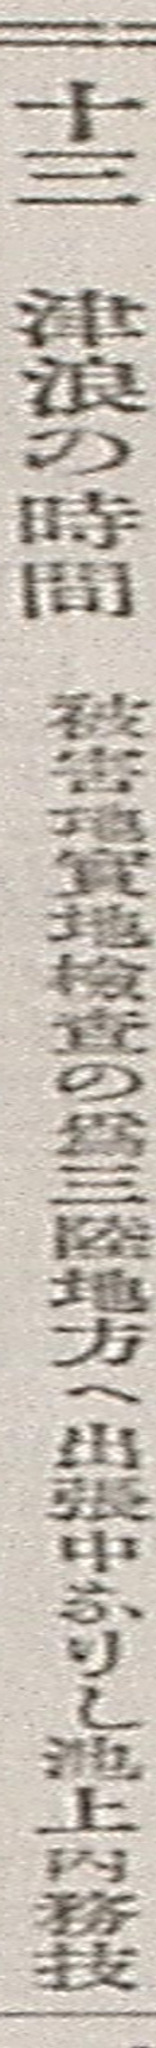十三津浪の時間被害地実地検査の為三陸地方へ出張中なりし池上内務技
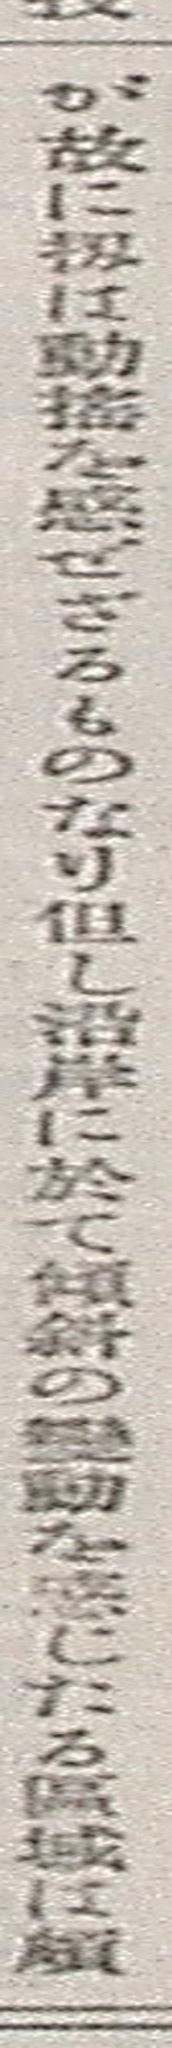が故に扨は動揺を感ぜざるものなり但し沿岸に於て傾斜の変動を感じたる区域は頗
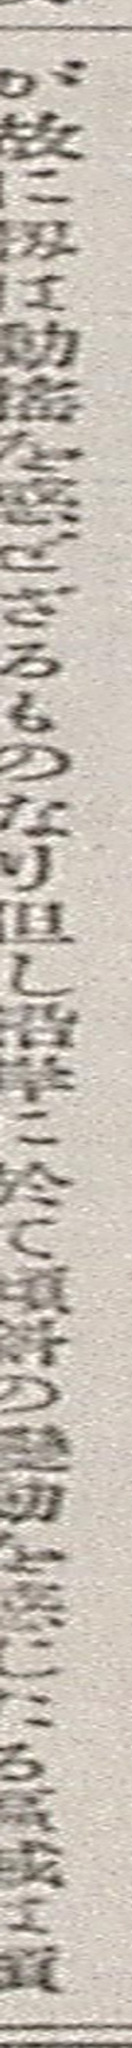が故に扨は動揺を感ぜざるものなり但し沿岸に於て傾斜の変動を感じたる区域は頗
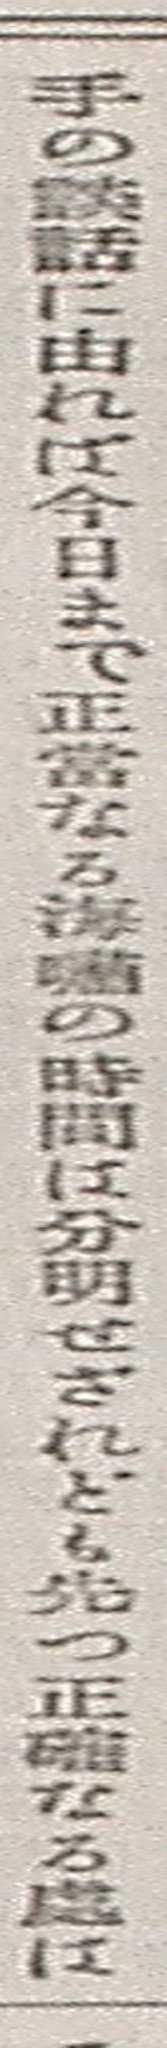手の談話に由れば今日まで正常なる海嘯の時間は分明せざれども先つ正確なる処は
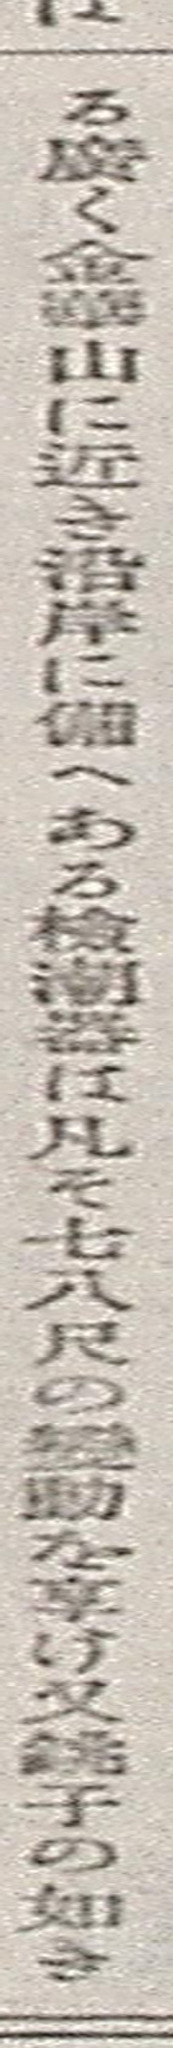る広く金華山に近き沿岸に備へある検潮器は凡そ七八尺の変動を享け又銚子の如き
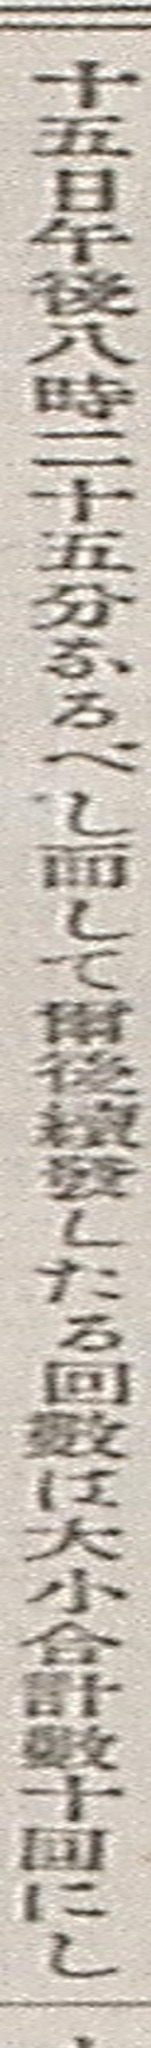十五日午後八時二十五分なるべし而して爾後続発したる回数は大小合計数十回にし
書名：風俗畫報臨時増刊第百十九號　大海嘯被害録（中）
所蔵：東京大学地震研究所図書室 Earthquake Research Institute Library, The University of Tokyo, JAPAN
